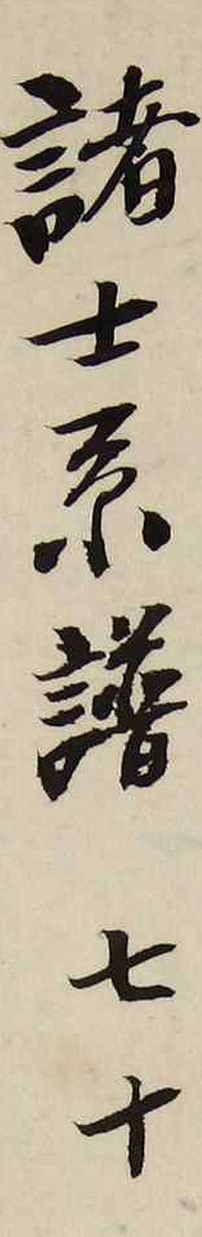諸士系譜七十

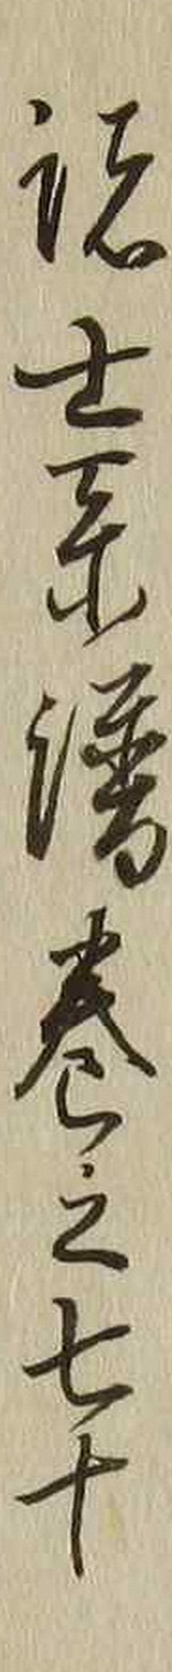諸士系譜巻之七十
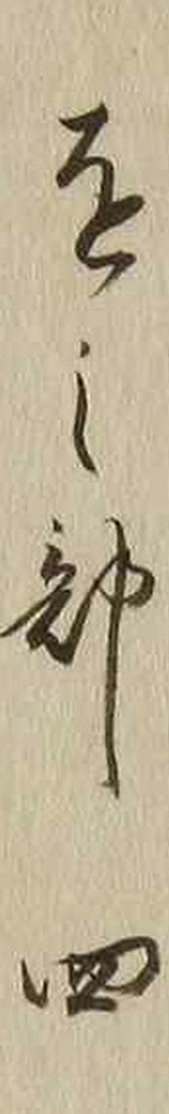を之部四
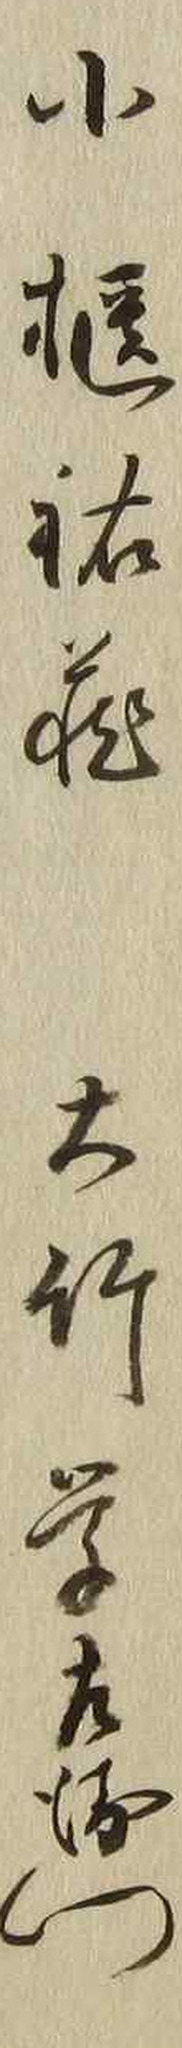小櫃祐蔵大竹学左衛門

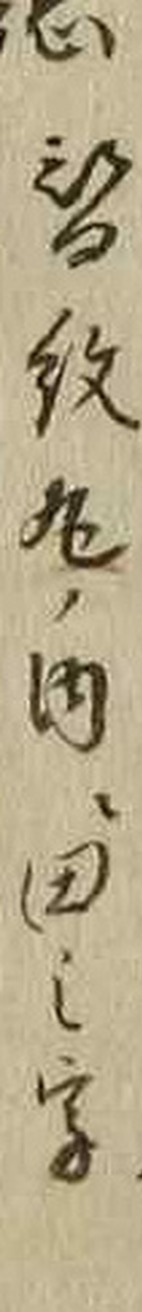替紋丸ノ内ニ田之字
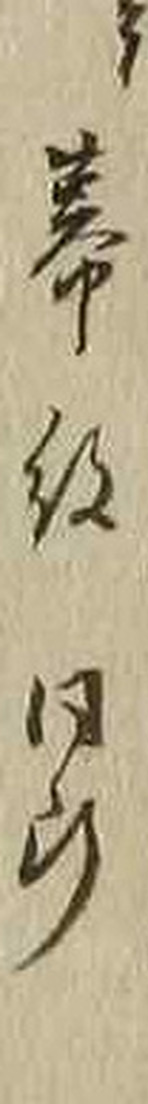幕紋同断
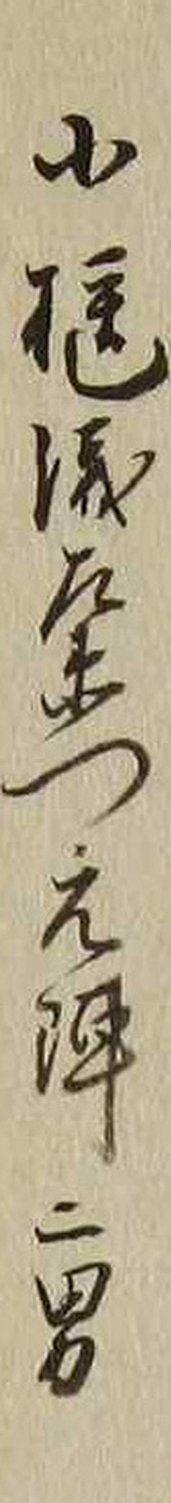小櫃儀左衛門元陣二男
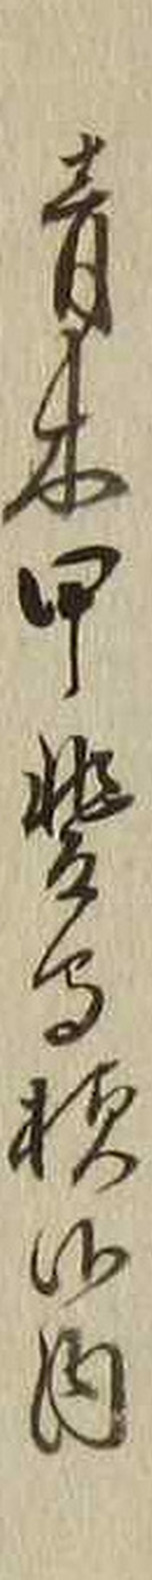青木甲斐守様御内
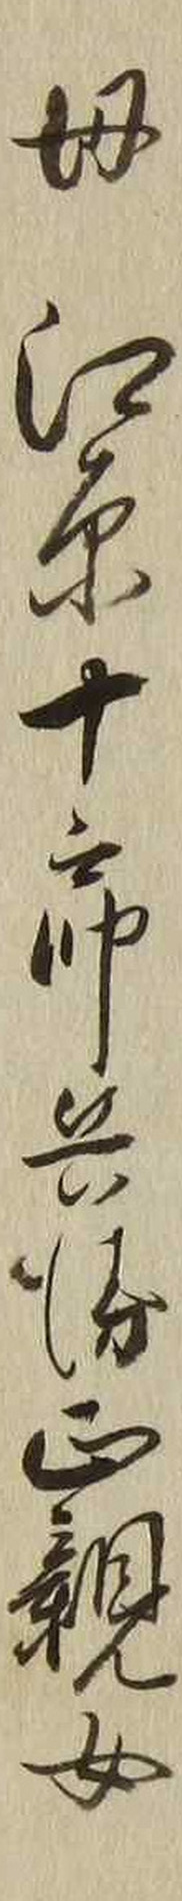母江原十郎兵衛正親女
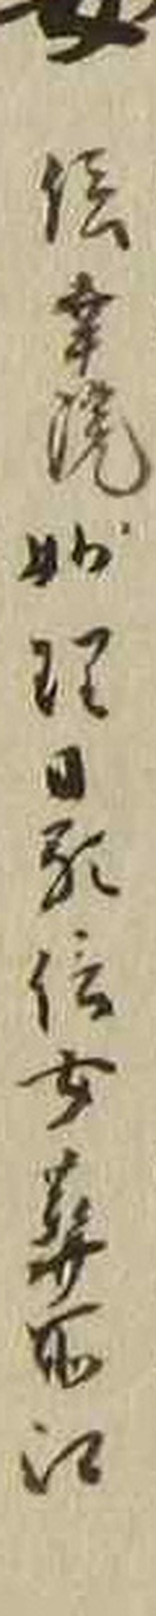伝幸院妙理日顕信女葬所江
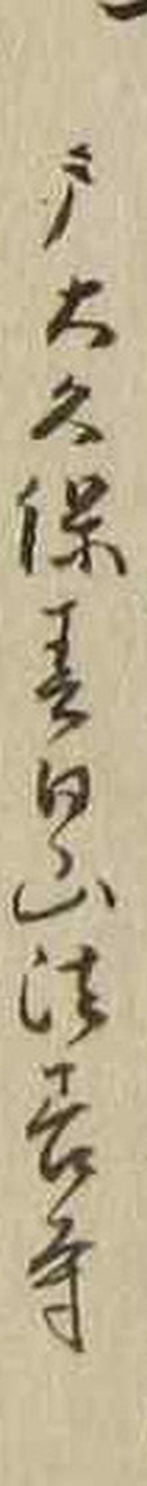戸大久保春日山法善寺
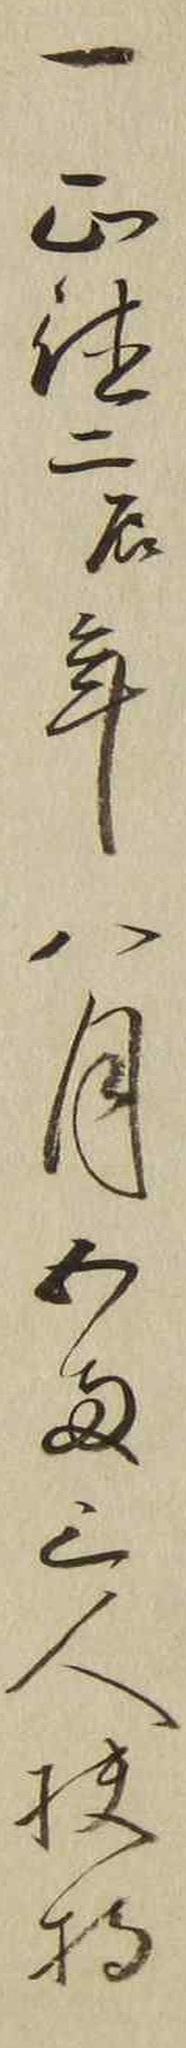一正徳二辰年八月五両三人扶持

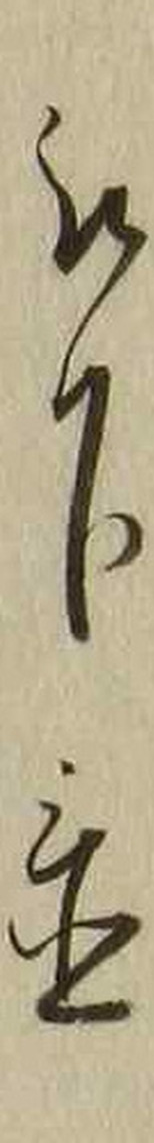被下置
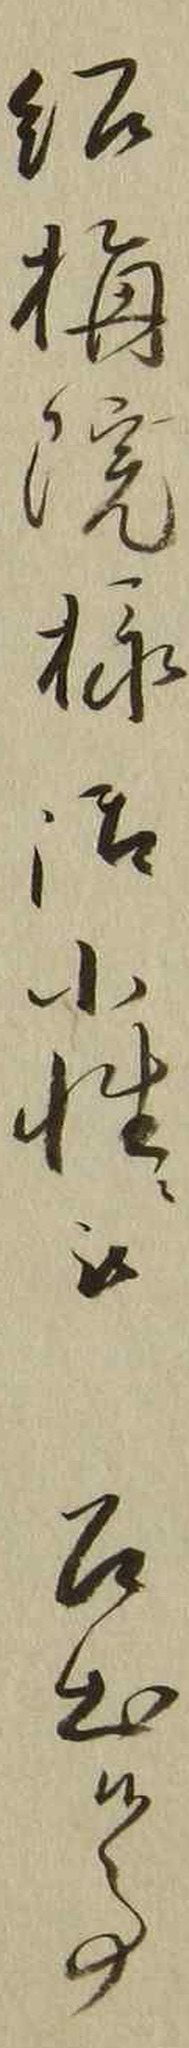紹栴院様御小姓ニ被召出候事
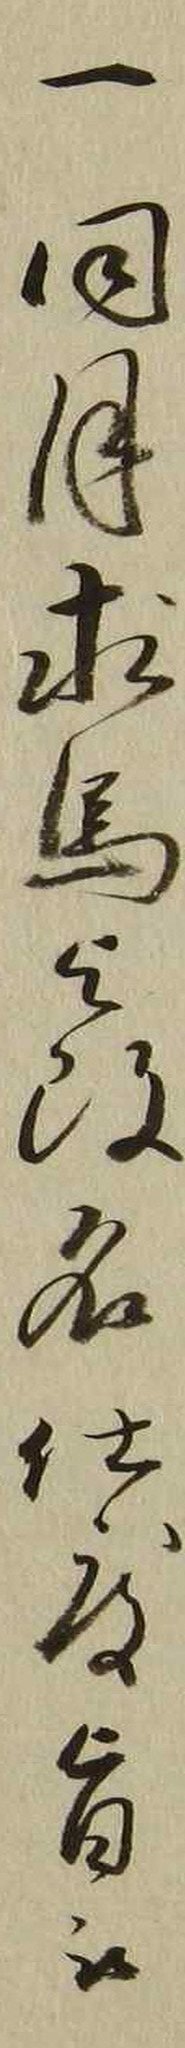一同月求馬与改名仕度旨被
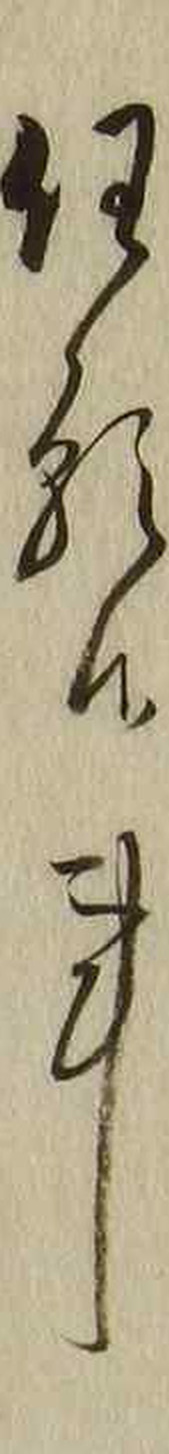任願候事
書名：諸士系譜　巻之70　を之部4
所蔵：会津若松市立会津図書館
